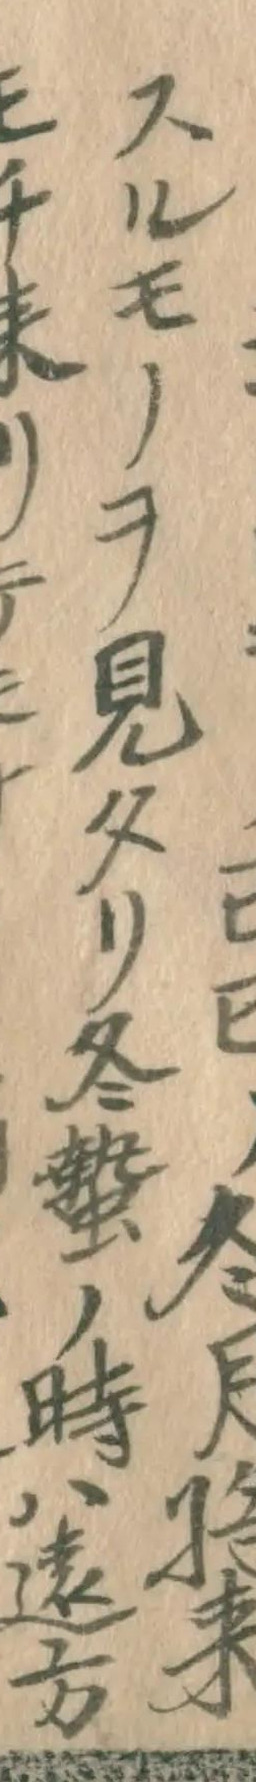スルモノヲ見タリ冬蟄ノ時ハ遠方
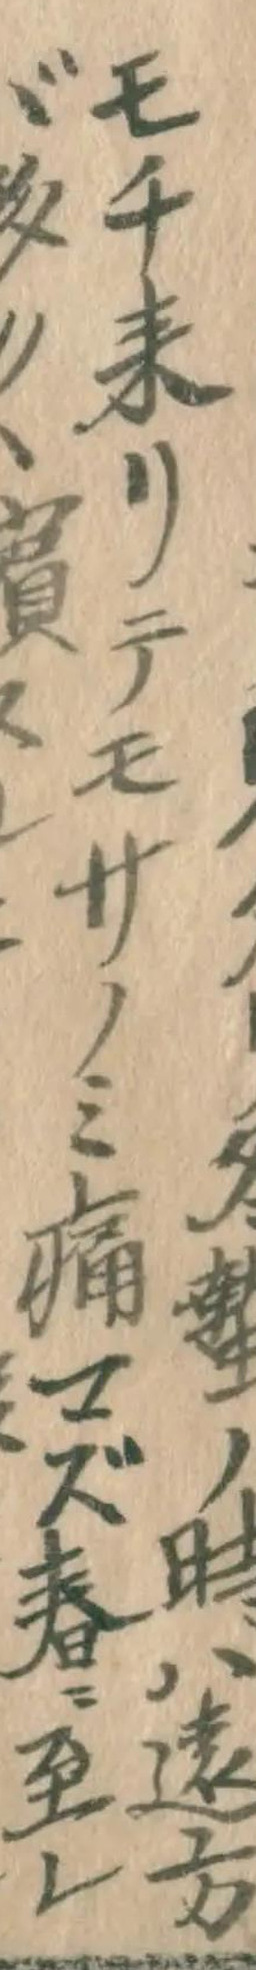モチ来リテモサノミ痛マズ春ニ至レ
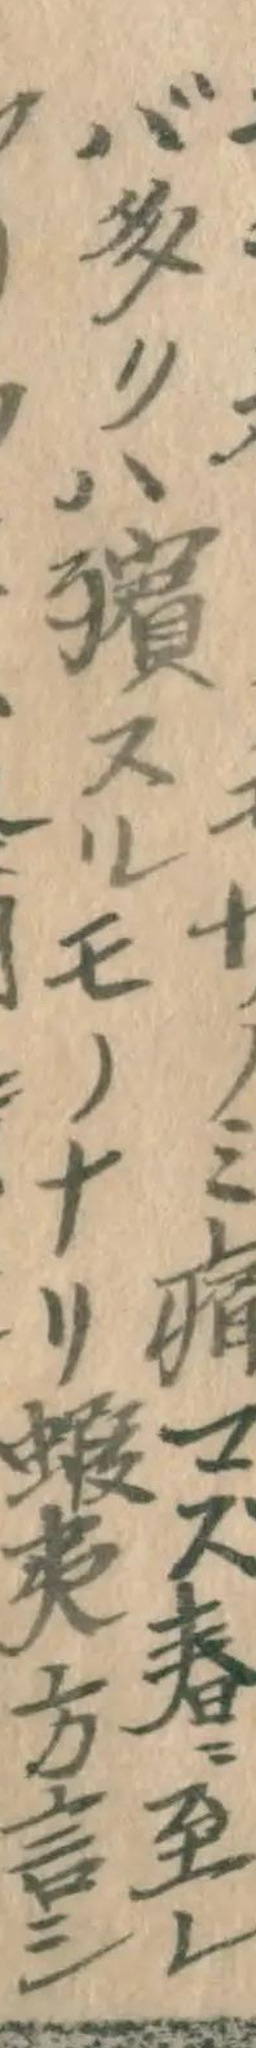バ多クハ殯スルモノナリ蝦夷方言シ
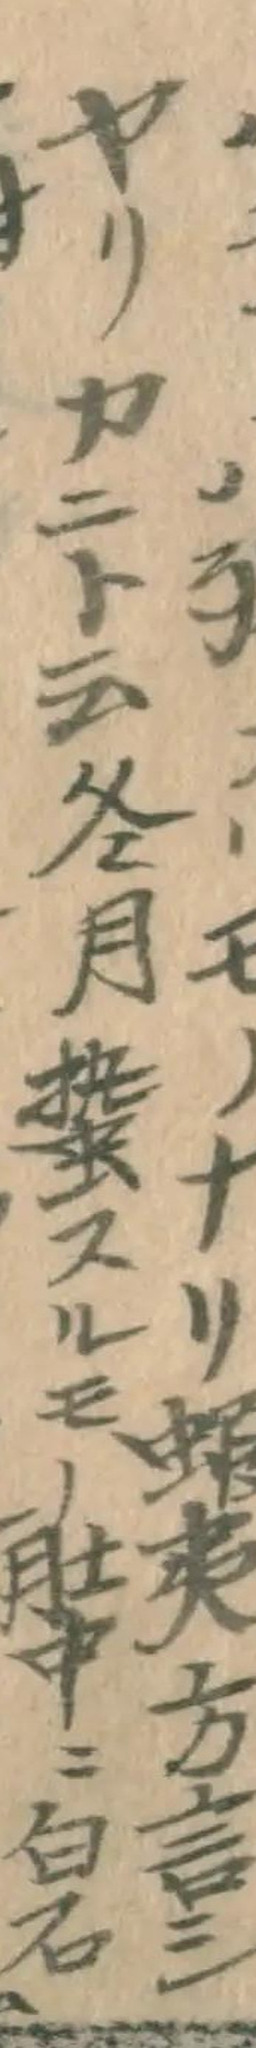ヤリカニト云冬月蟄スルモノ肚中ニ白石
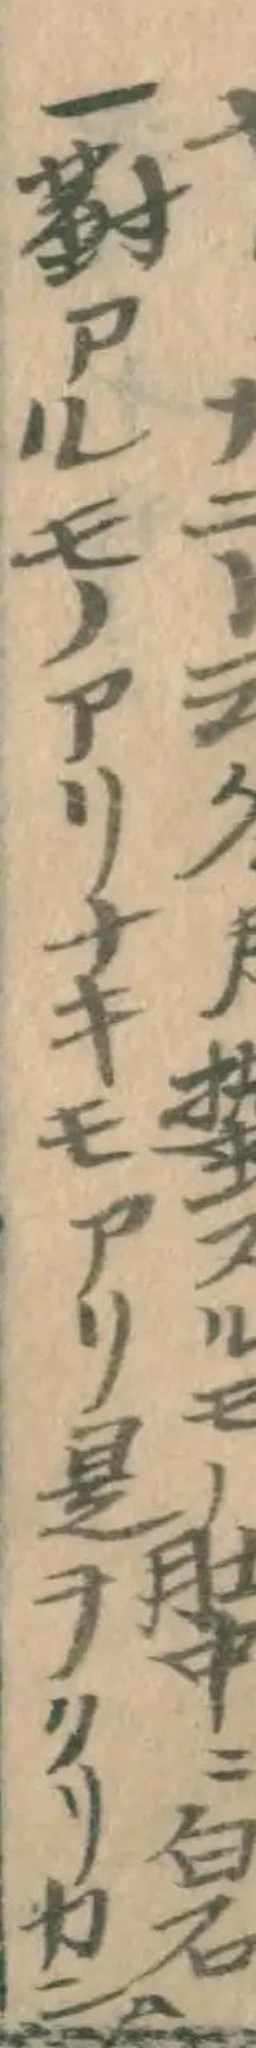一對アルモノアリナキモアリ是ヲクリカニ△

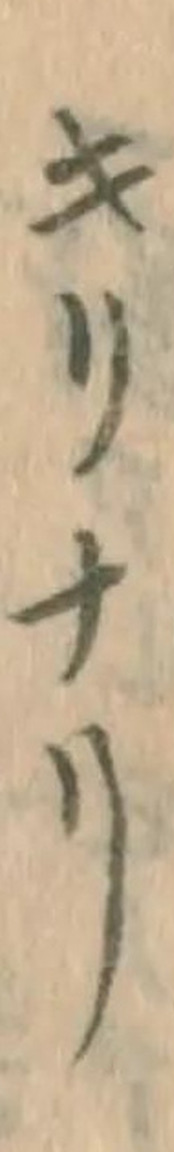キリナリ
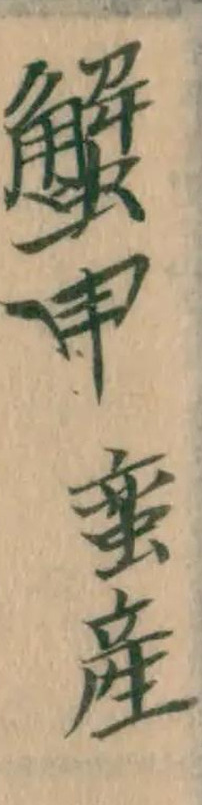蟹甲蛮産
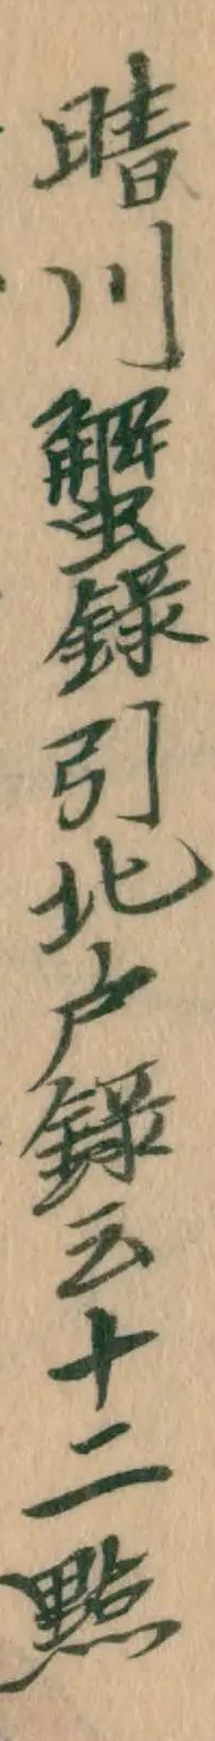晴川蟹録引北戸録云十二點
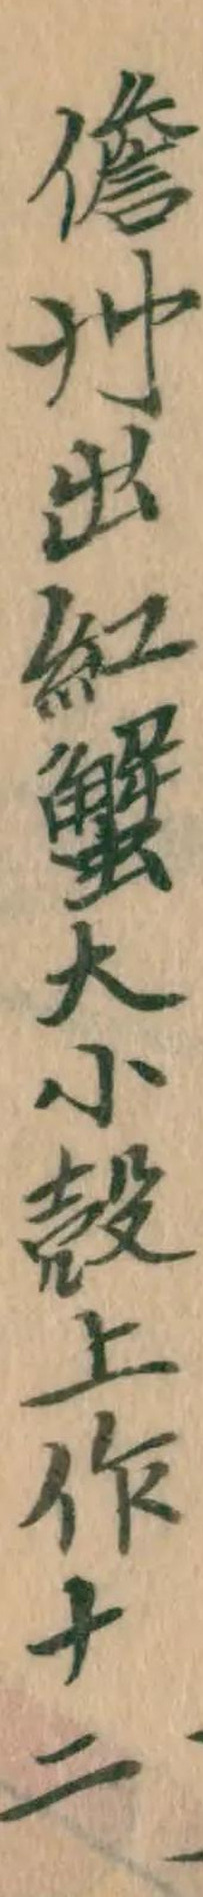儋州出紅蟹大小殻上作十二
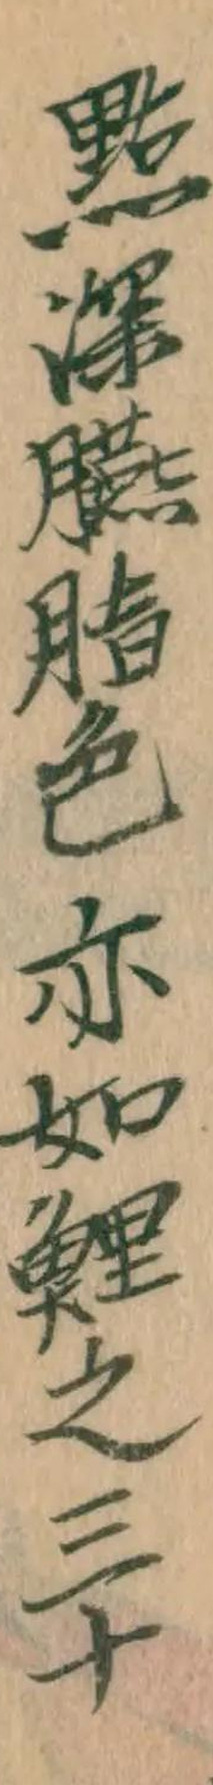點深臙脂色亦如鯉之三十
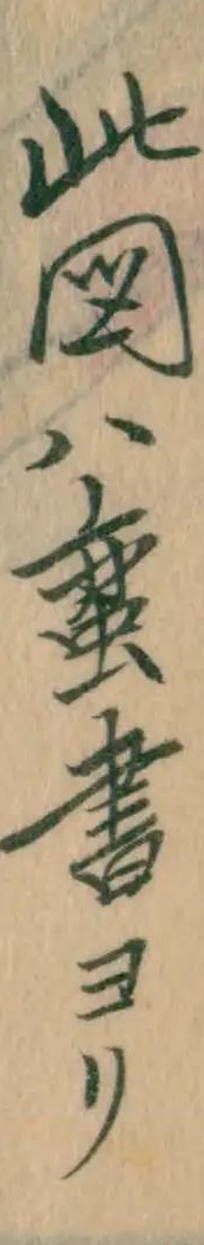此図ハ蛮書ヨリ
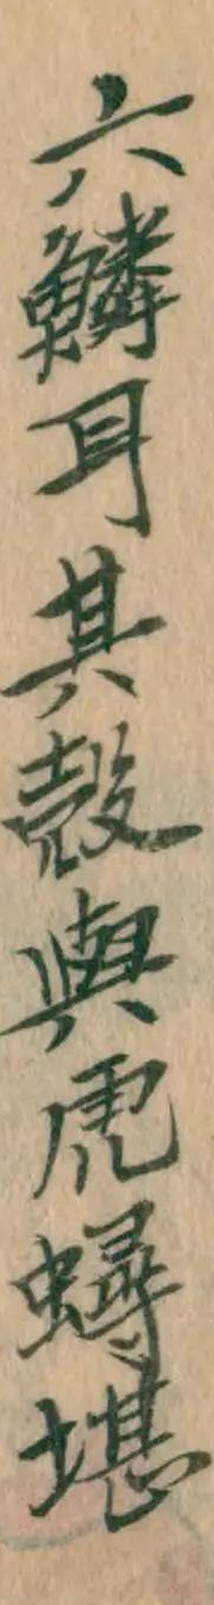六鱗耳其殻與虎蟳堪
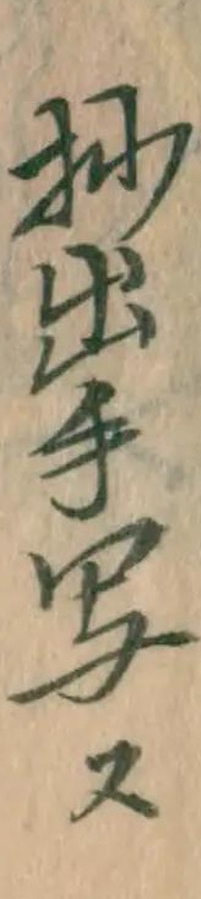抄出手写ス
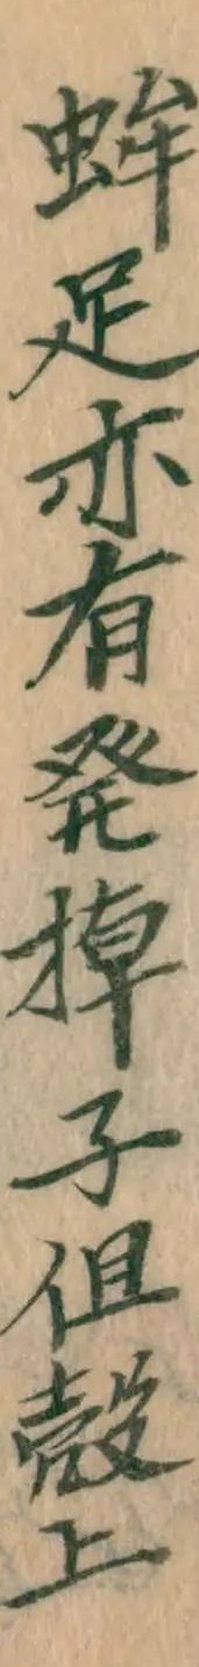蛑足亦有発棹子但殻上
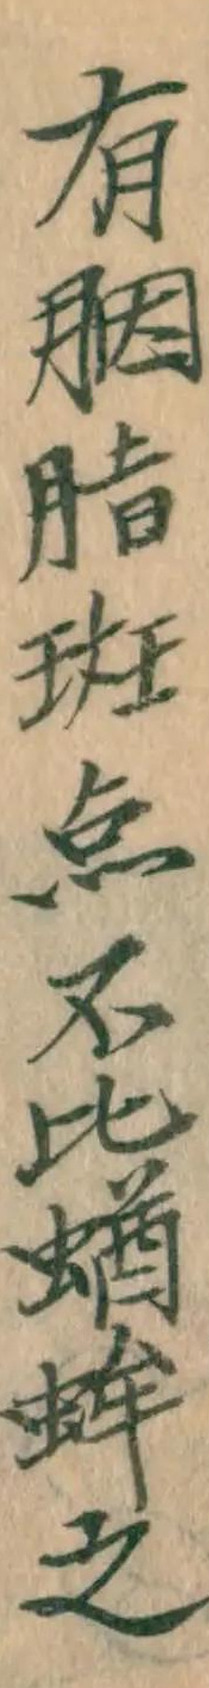有胭脂斑点不比蝤蛑之
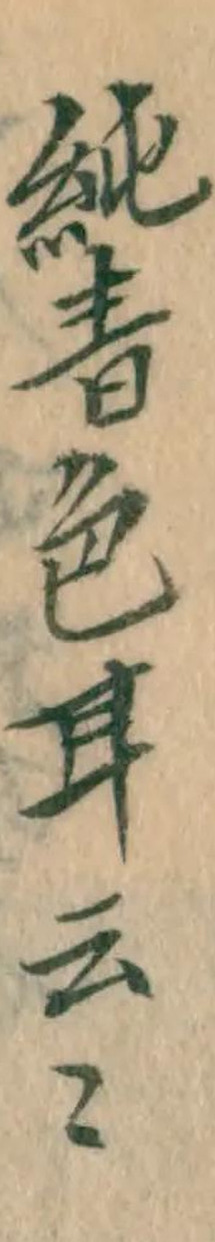純青色耳云々
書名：千蟲譜 3巻. [2]
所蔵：国立国会図書館 National Diet Library, JAPAN
